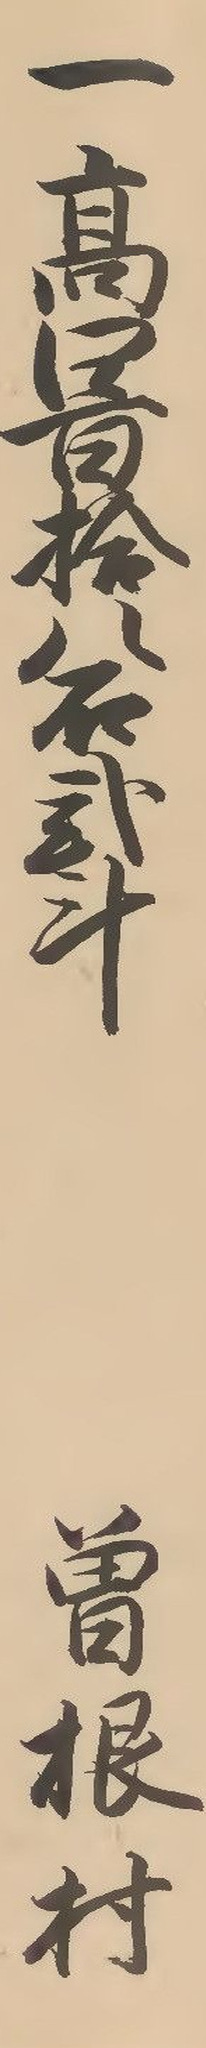一髙四百拾八石弐斗曽根村
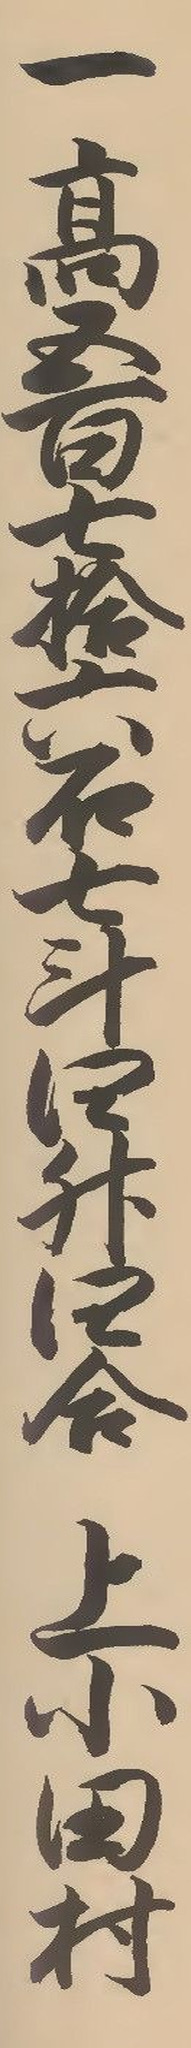一髙五百七拾六石七斗四升四合上小田村
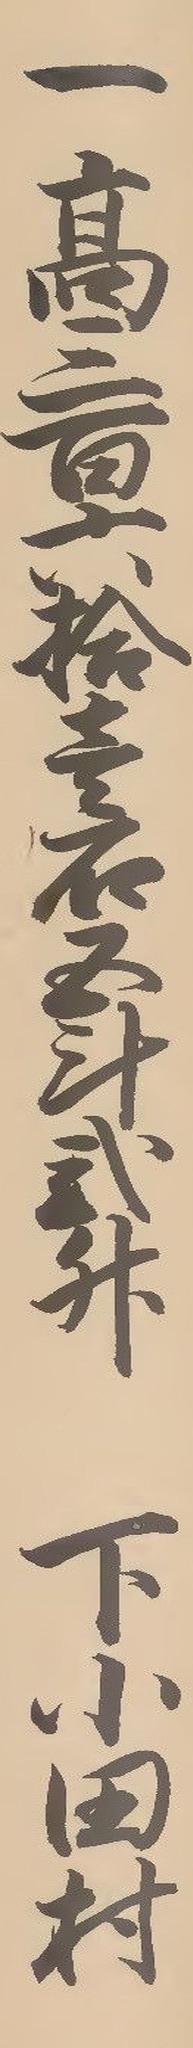一髙三百六拾壱石五斗弐升下小田村
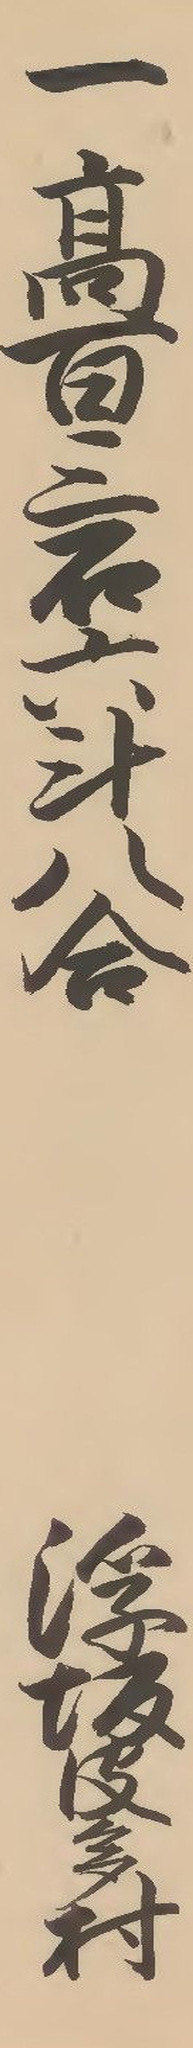一髙百三石六斗八合浮坂皮多村
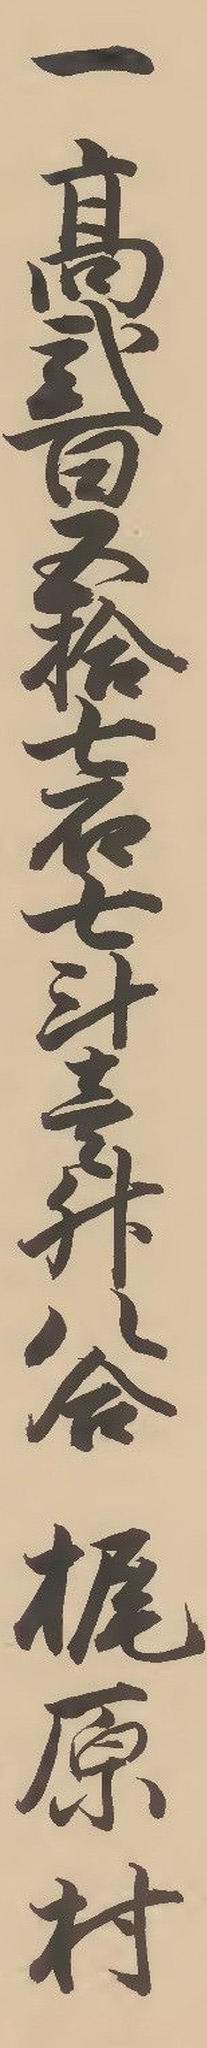一髙弐百五拾七石七斗壱升八合梶原村

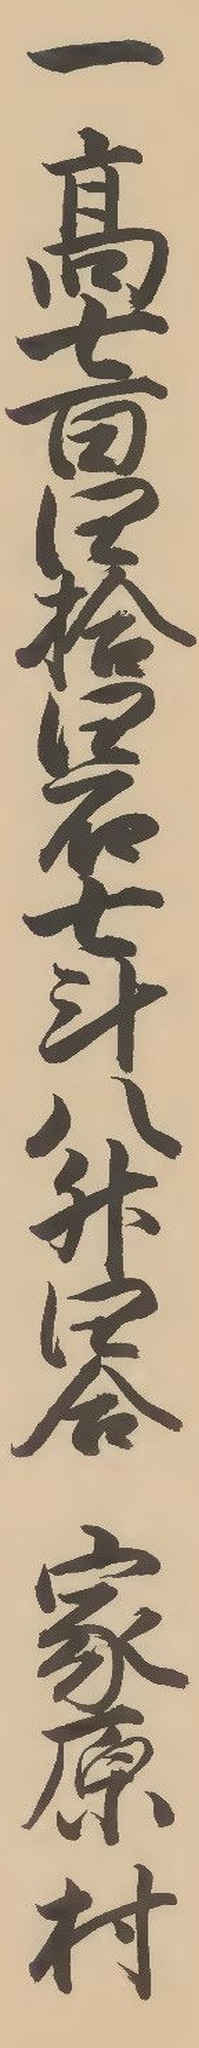一髙七百四拾四石七斗八升四合家原村
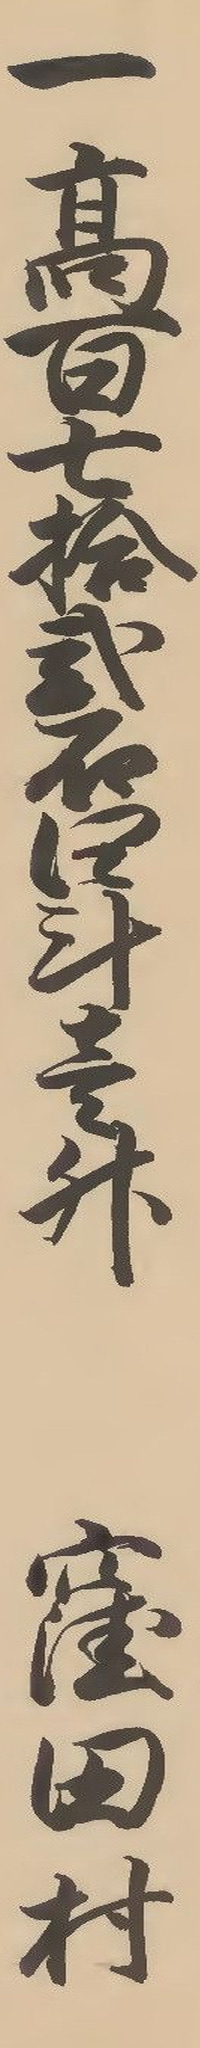一髙百七拾弐石四斗壱升窪田村
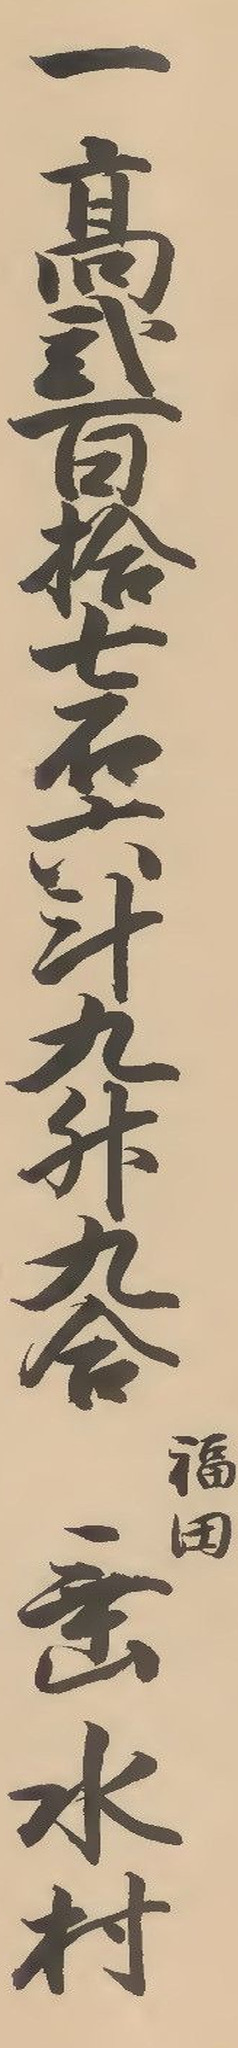一髙弐百拾七石六斗九升九合垂水村
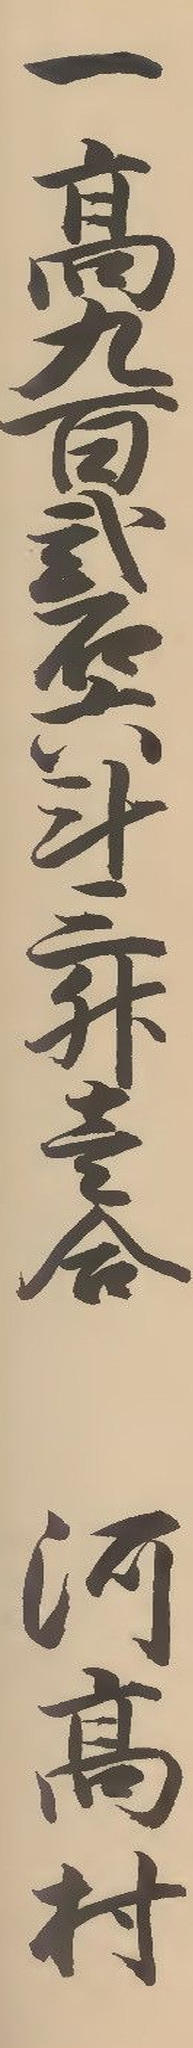一髙九百弐石六斗三升壱合河髙村
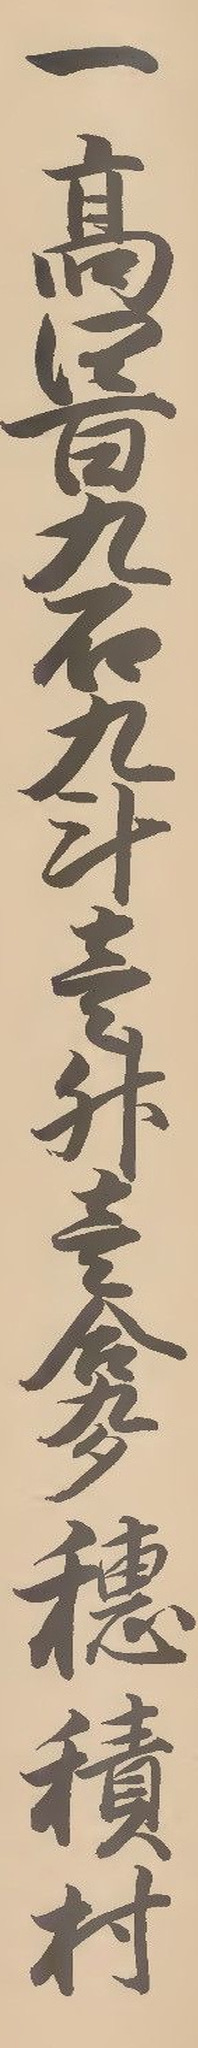一髙四百九石九斗壱升壱合九夕穂積村
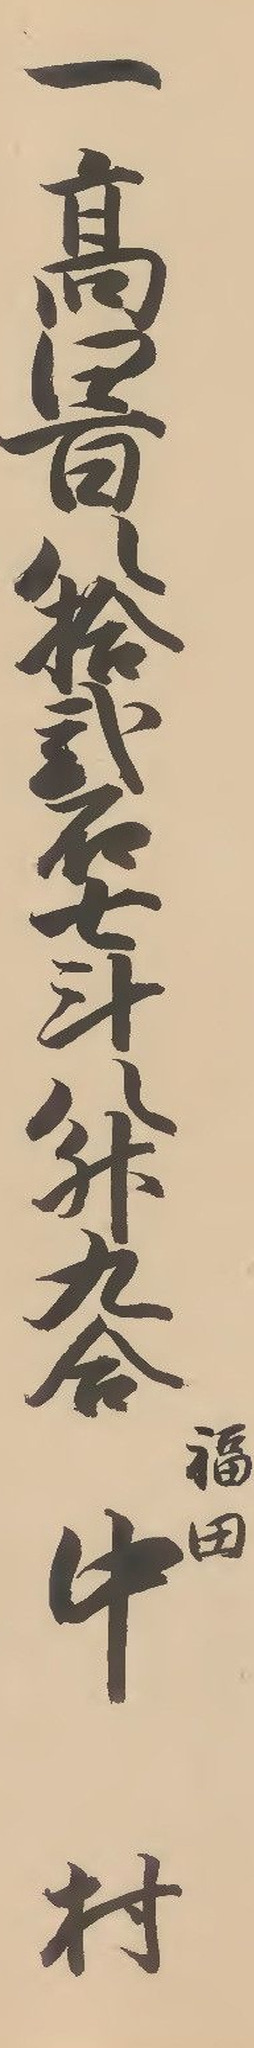一髙四百八拾弐石七斗八升九合中村
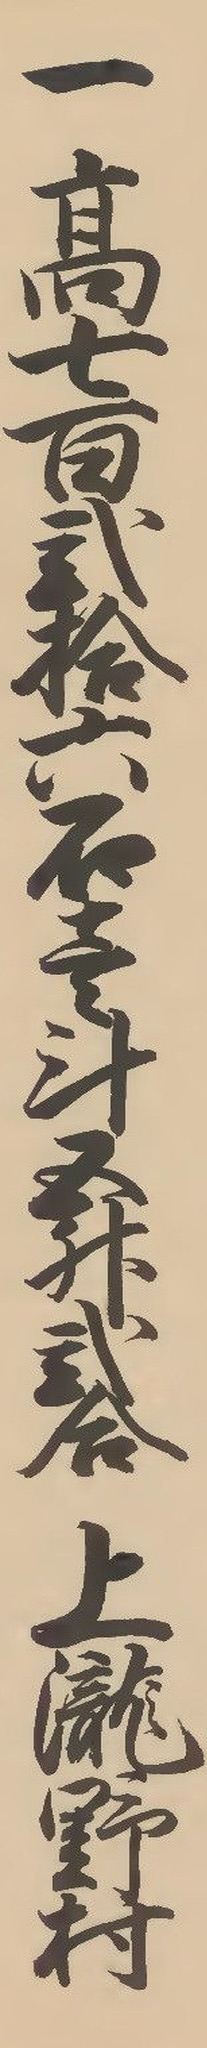一髙七百弐拾六石壱斗五升弐合上瀧野村
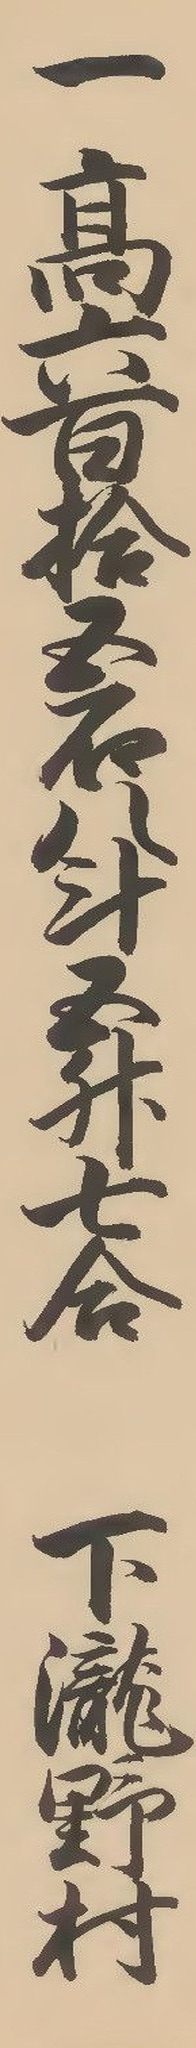一髙六百拾五石八斗五升七合下瀧野村

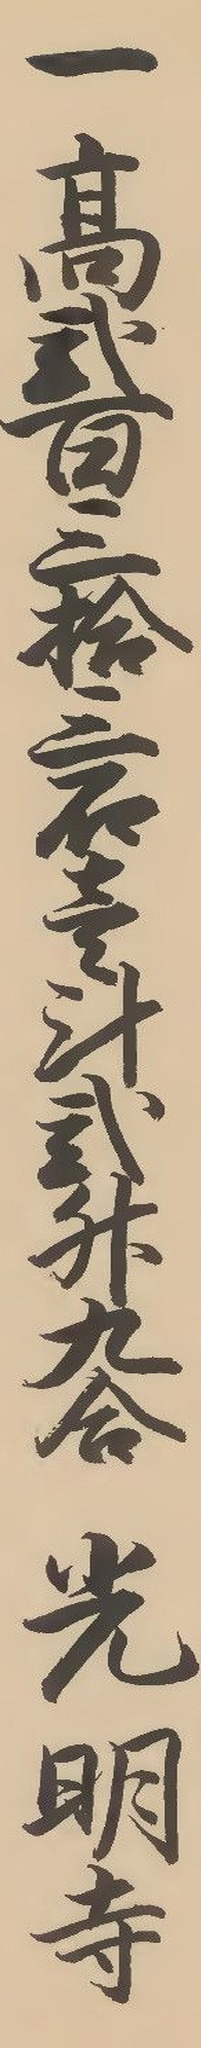一髙弐百三拾三石壱斗弐升九合光明寺
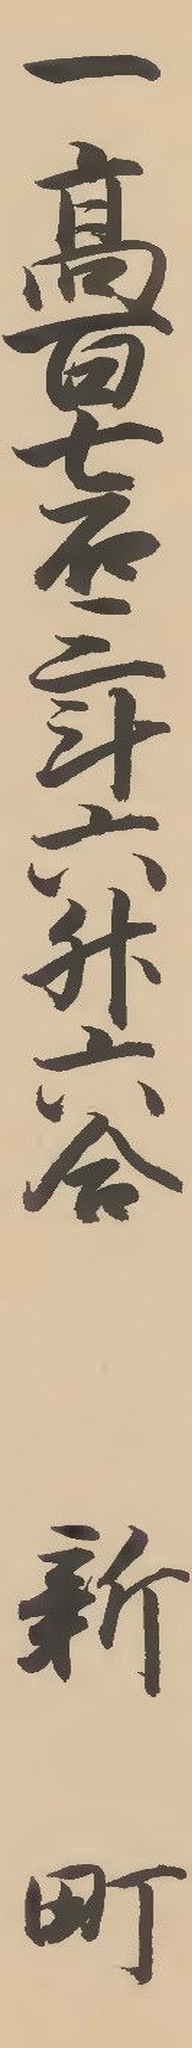一髙百七石三斗六升六合新町
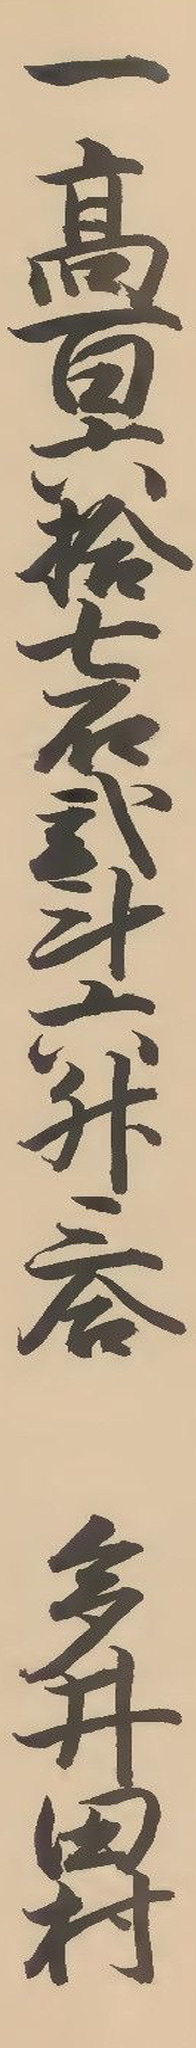一髙百六拾七石弐斗六升三合多井田村
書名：播磨国郷帳
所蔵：国立公文書館 National Archives of Japan
